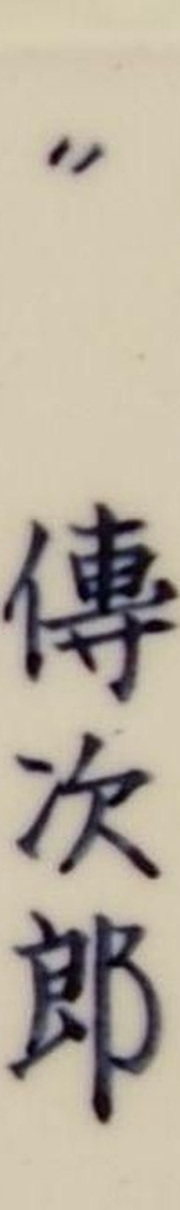傳次郎
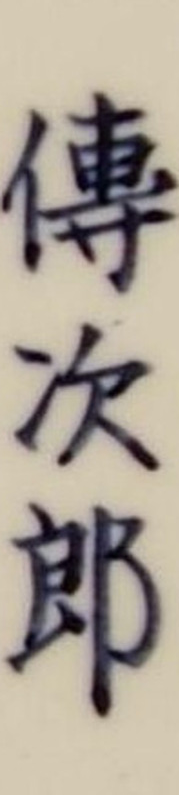傳次郎
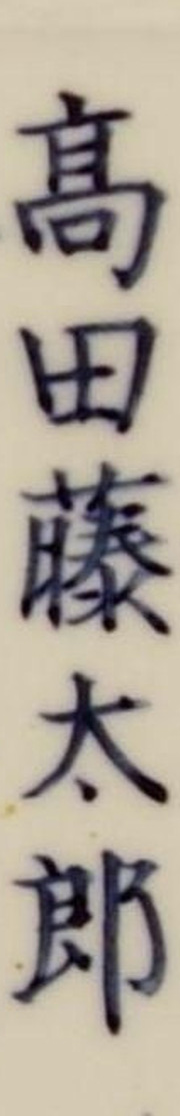高田藤太郎
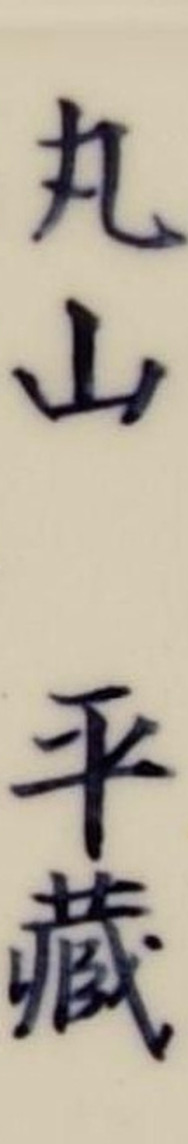丸山平蔵
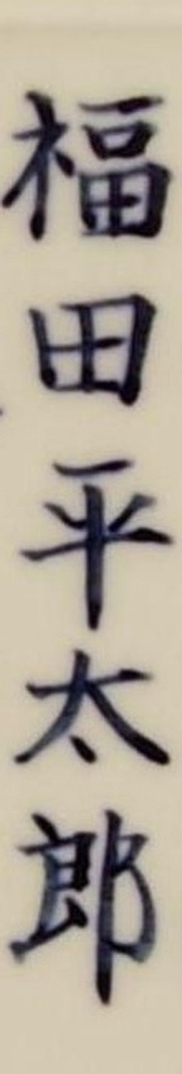福田平太郎
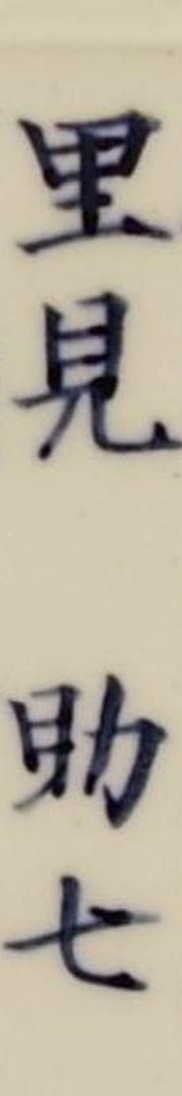里見助七
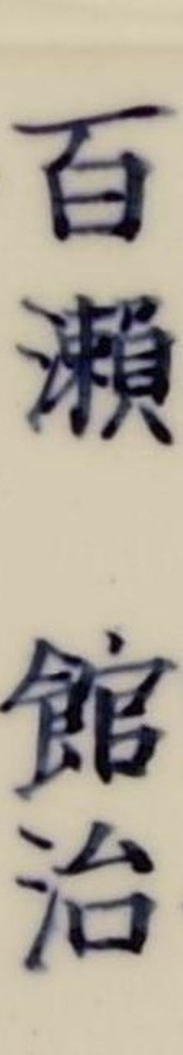百瀬館治
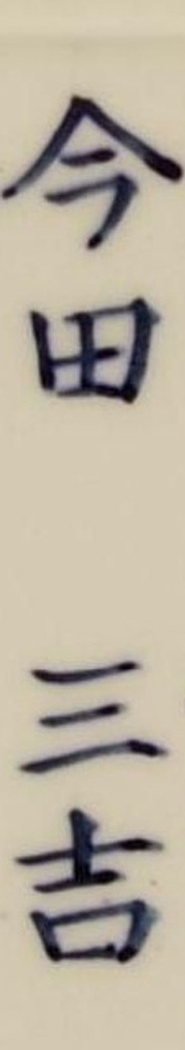今田三吉
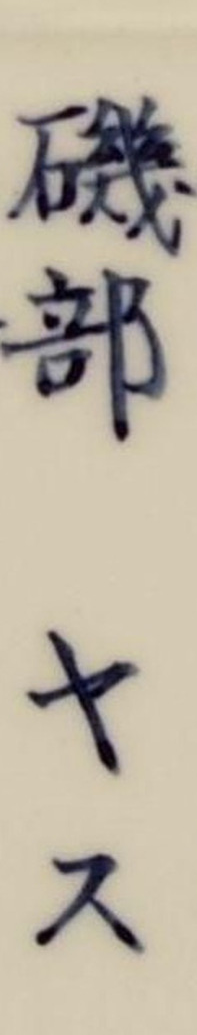磯部ヤス
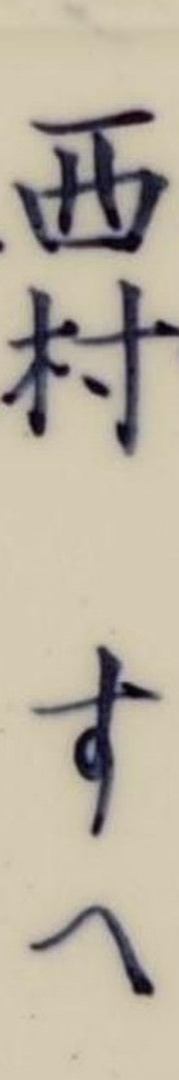西村すへ
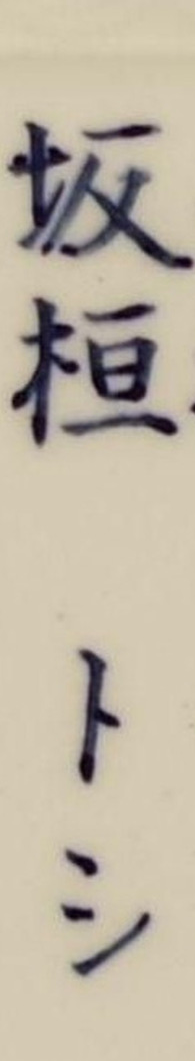坂垣トシ
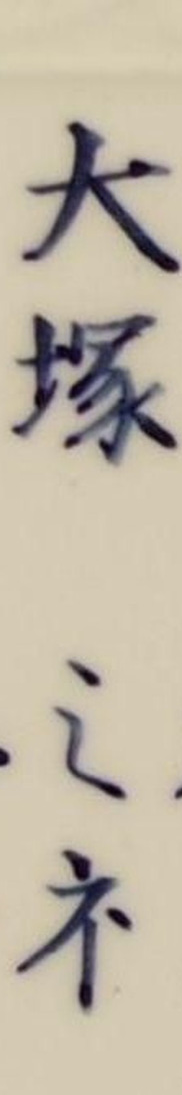大塚之ネ
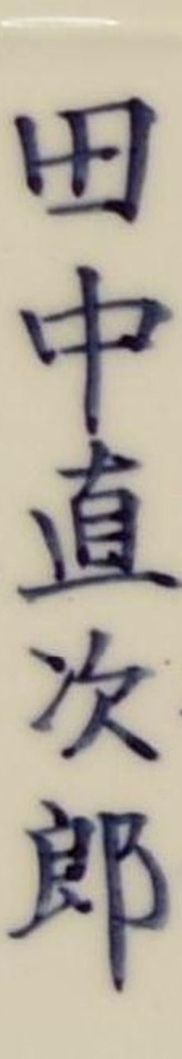田中直次郎
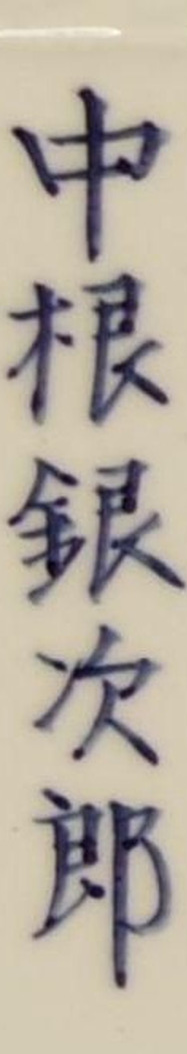中根銀次郎
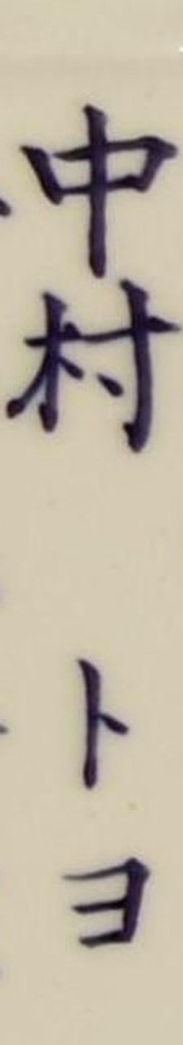中村トヨ
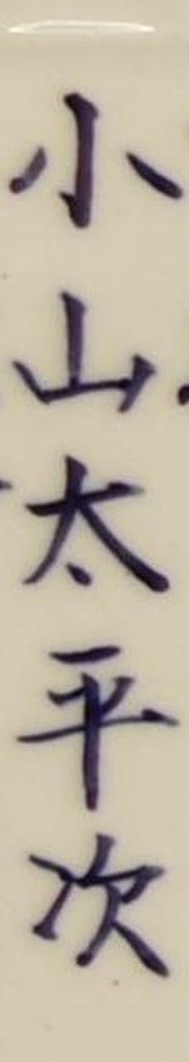小山太平次
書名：A~D
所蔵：koyasan kongobuji
